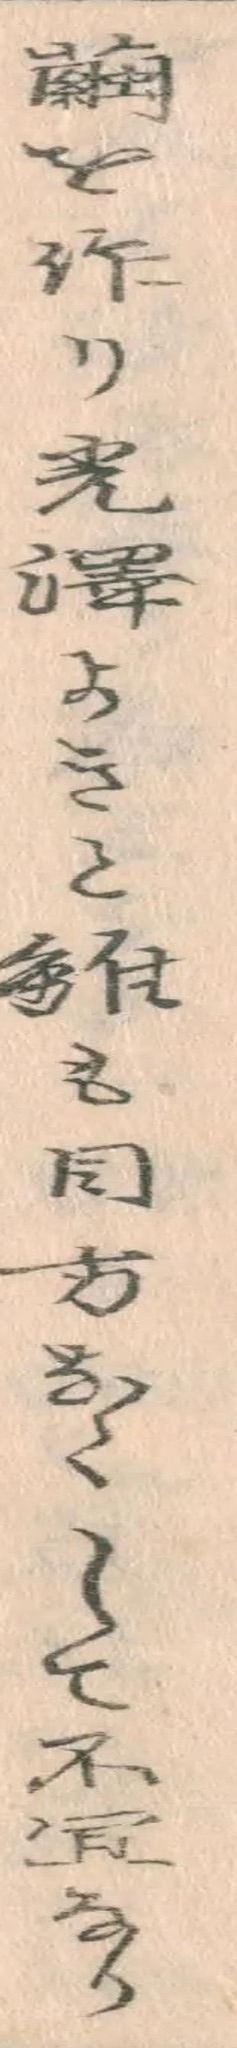繭を作り光沢よきと雖も目方なくして不宜なり
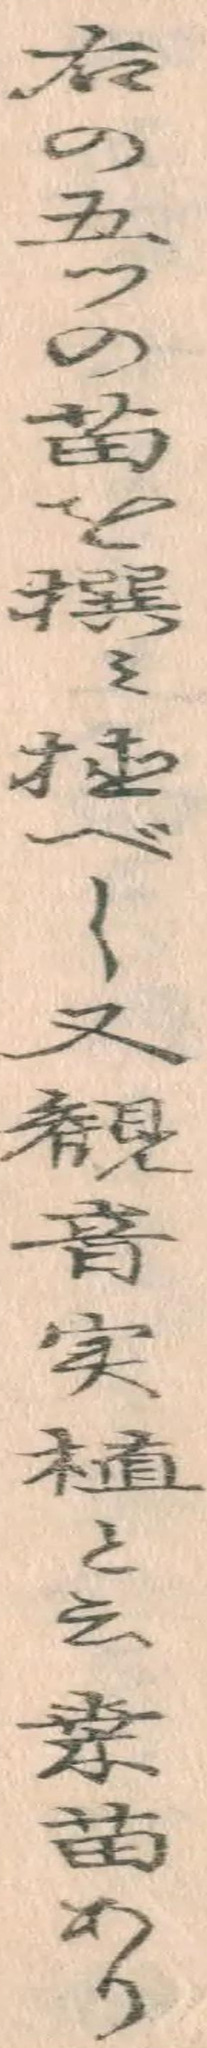右の五ッの苗を撰み植べし又観音実植と云桑苗あり
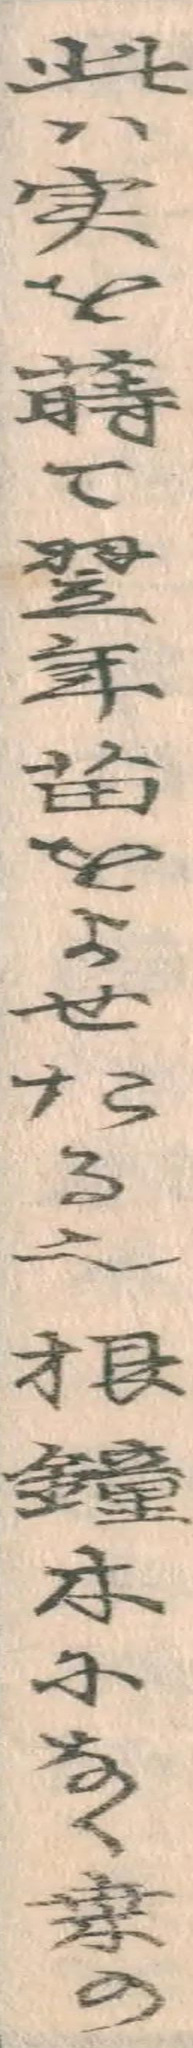此は実を蒔て翌年苗をよせたる也根鐘木になく桑の
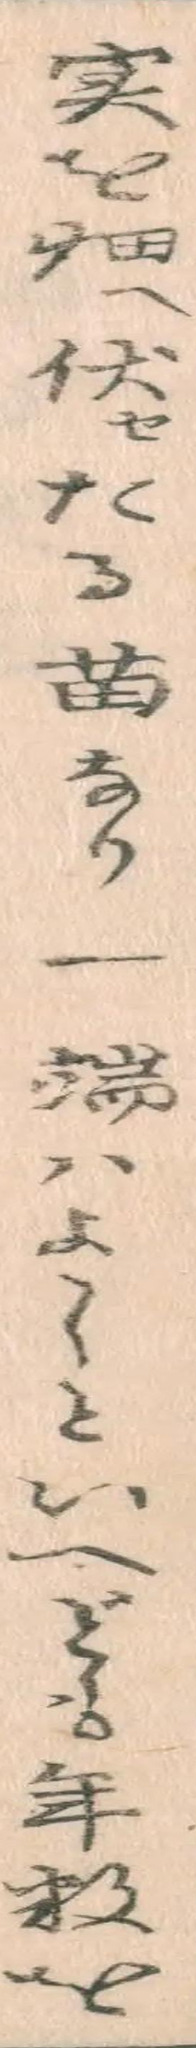実を畑へ伏せたる苗なり一端はよしといへども年数を
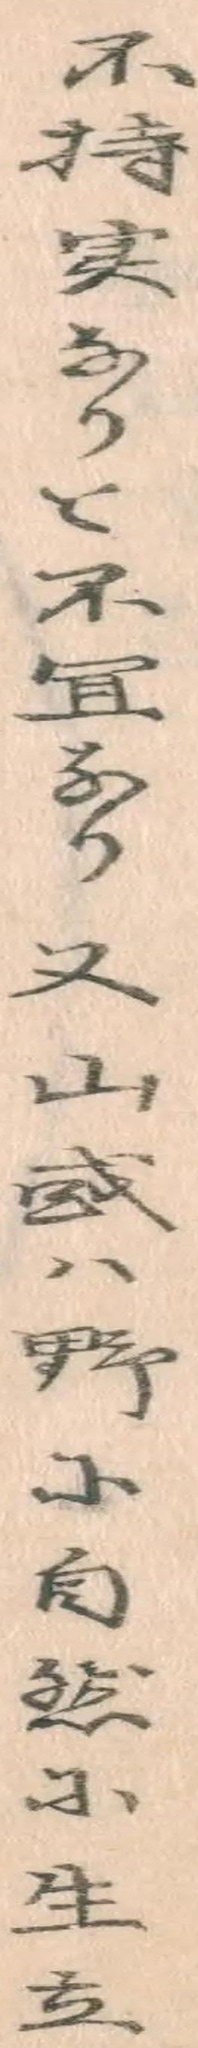不持実なりと不宜なり又山或は野に自然に生立
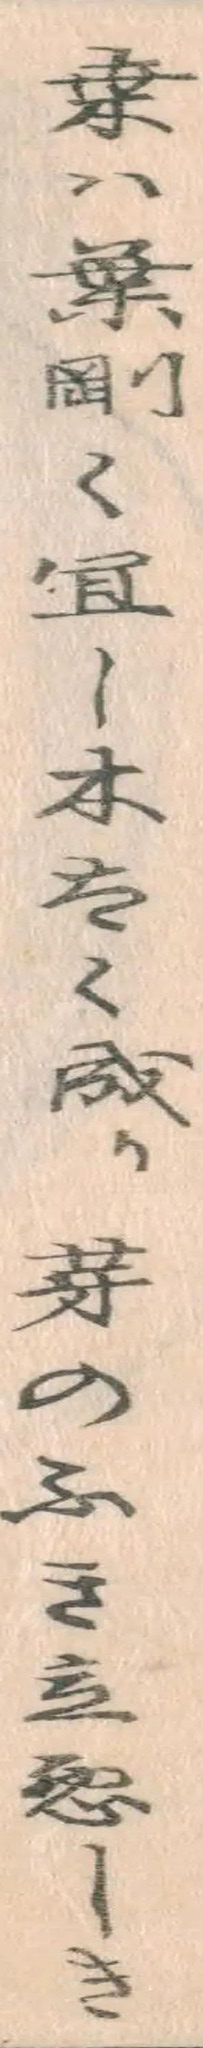桑は葉剛く宜し木太く成り芽のふき立悪しき
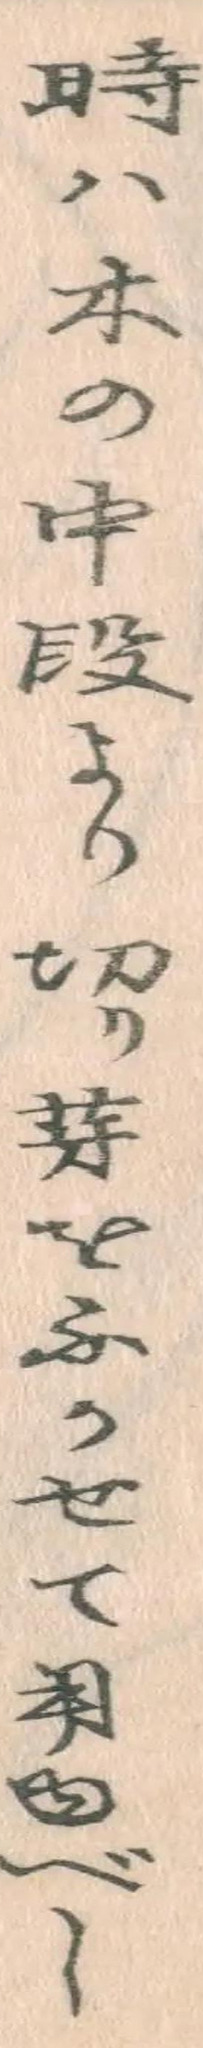時は木の中段より切り芽をふかせて用ゆべし
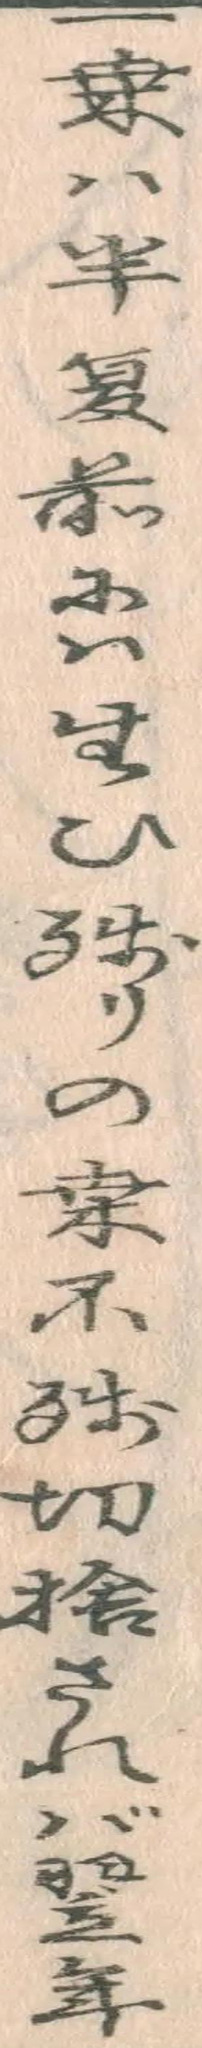一桑は半夏前には生ひ残りの桑不残切捨されば翌年
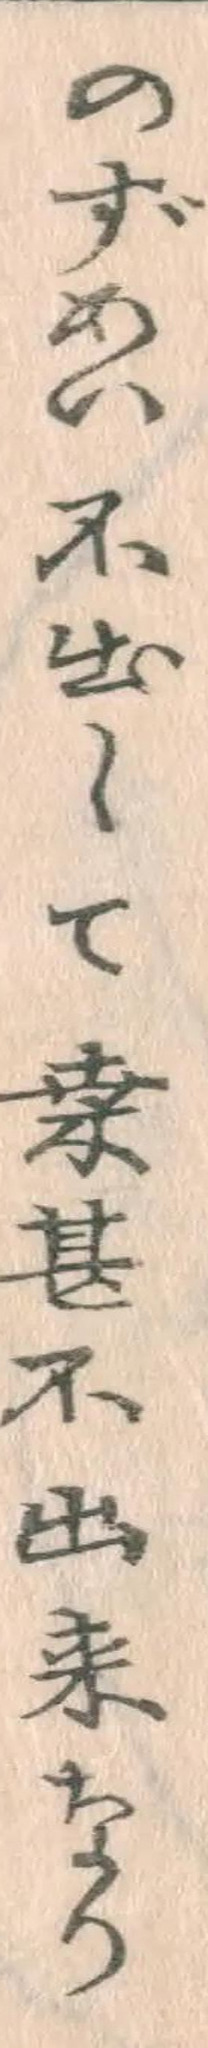のずあい不出して桑甚不出来なり
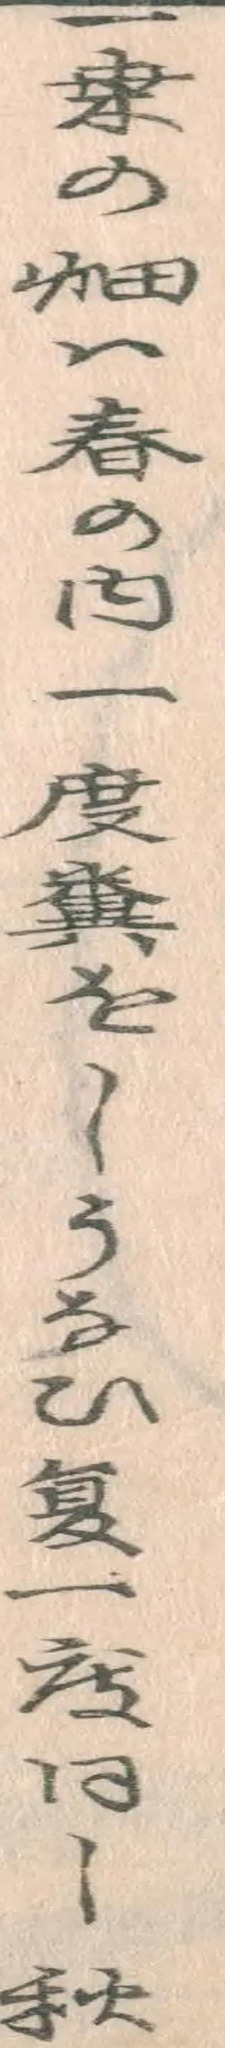一桑の畑は春の内一度糞をしうなひ夏一度同し秋
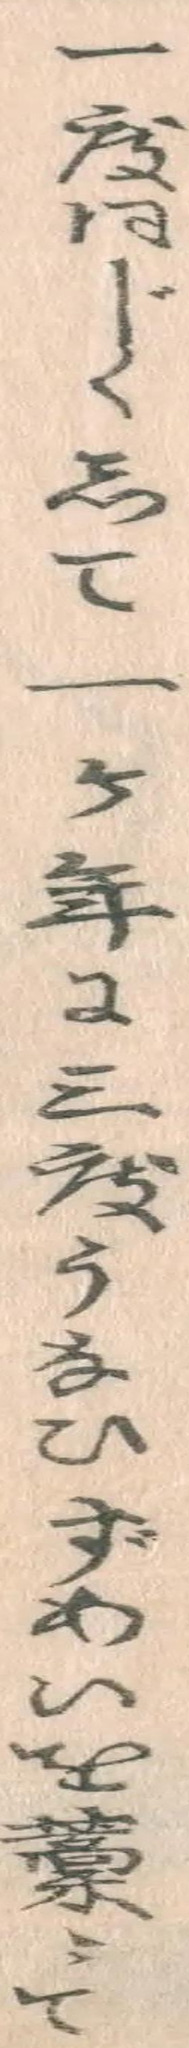一度同じくして一ヶ年に三度うなひずあいを藁にて
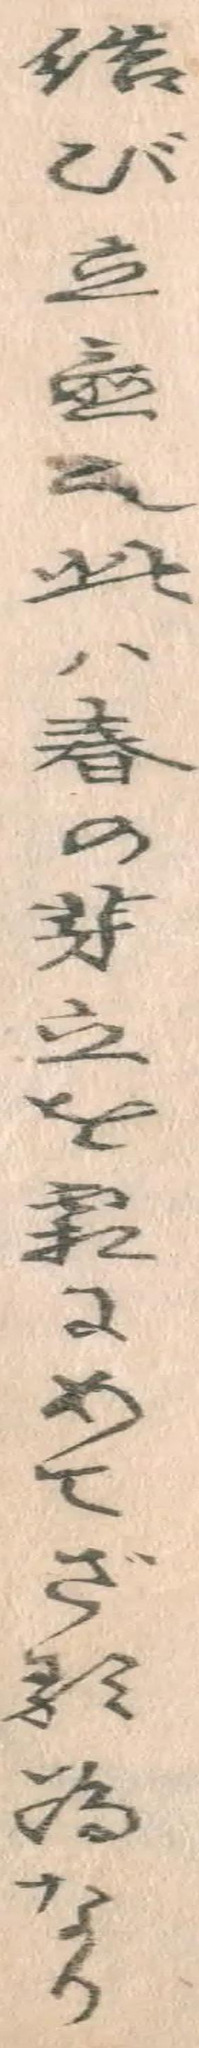結び立置也此は春の芽立を霜にあてざる為なり
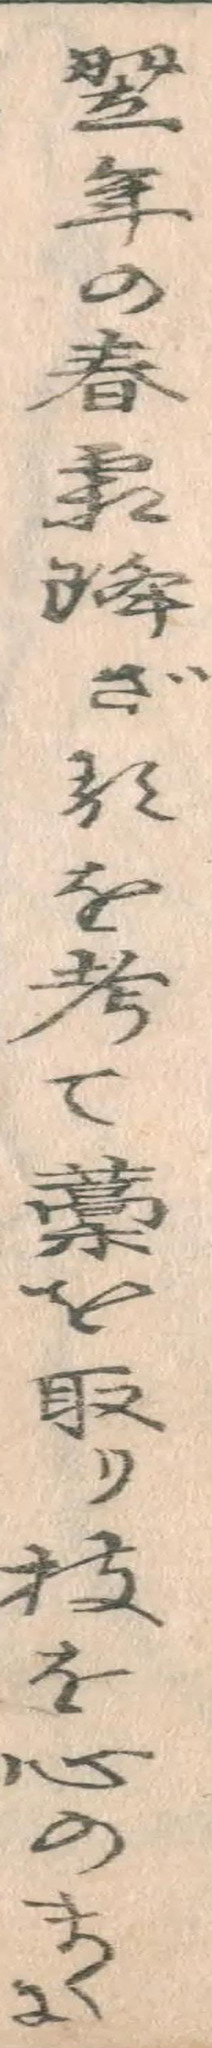翌年の春霜降ざるを考て藁を取り枝を心のまゝに
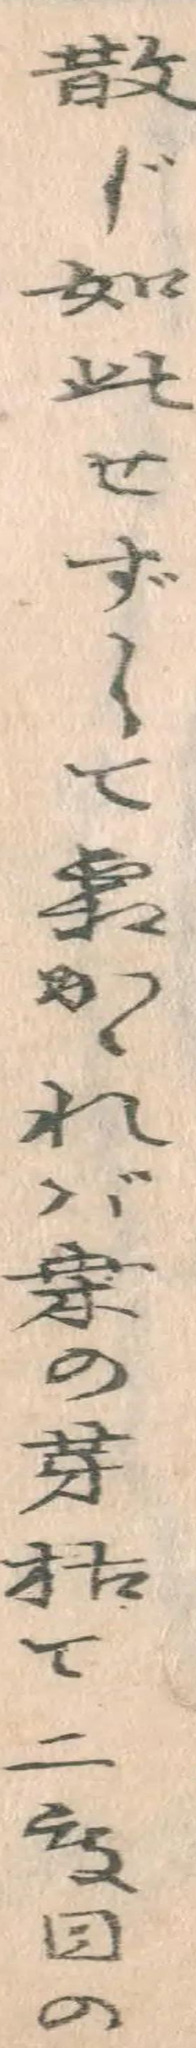散じ如此せずして霜かゝれば桑の芽枯て二度目の
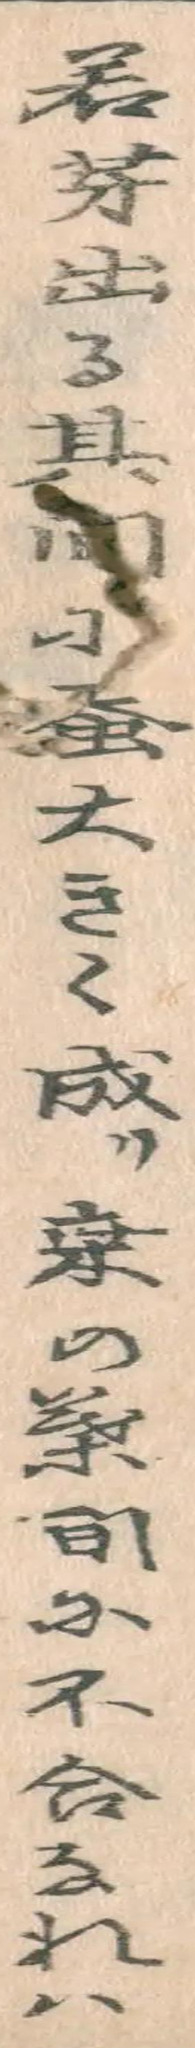若芽出る其間に蚕大きく成り桑の葉間に不合なれは
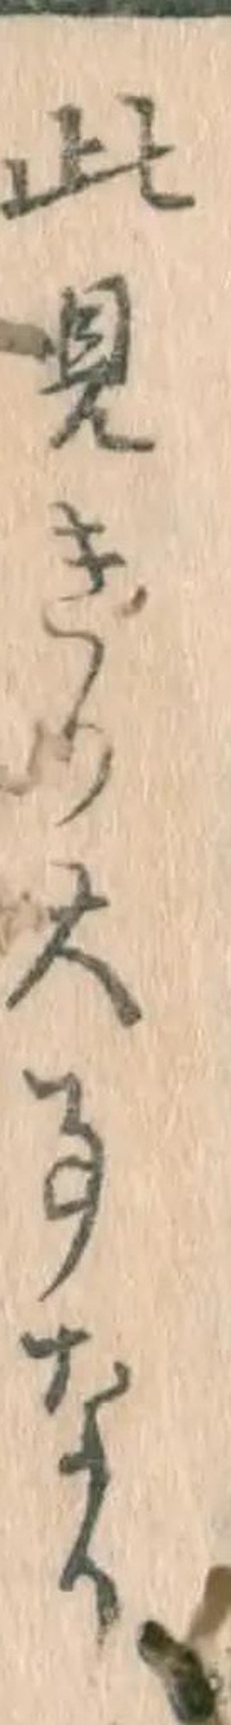此見きり大事なり
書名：機織彙編 5巻. [1]
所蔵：国立国会図書館 National Diet Library, JAPAN
